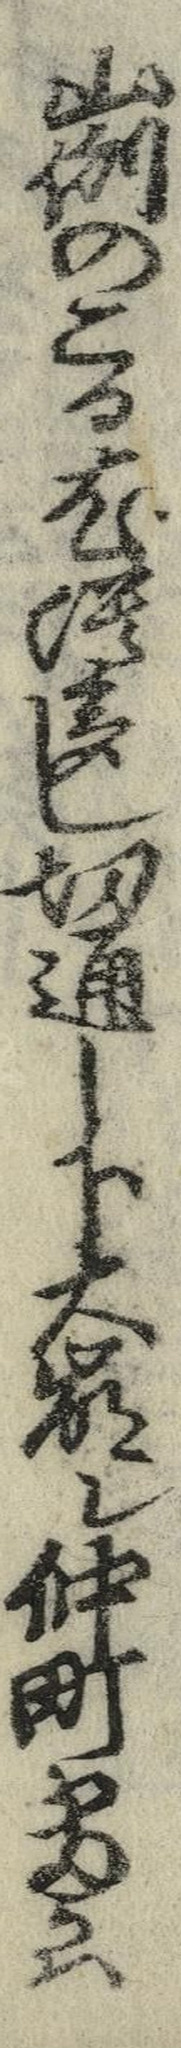山側のこる尤潰多し切通し下大崩仲町両かは
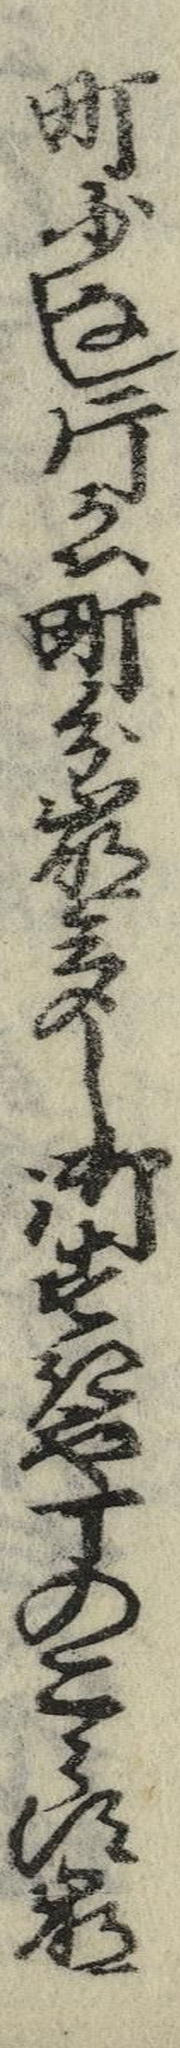町少なし片かは町分崩多し御すきや丁のこらす崩
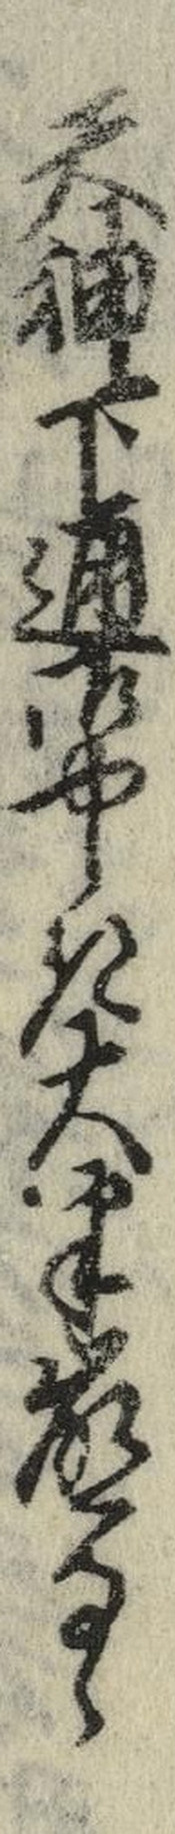天神下通御やしき大半崩るゝ
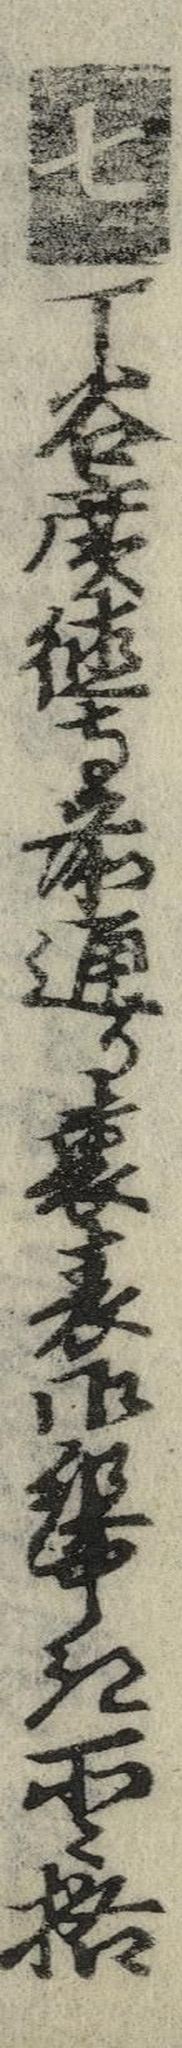七下谷広徳寺前通り裏表御組やしき所々格
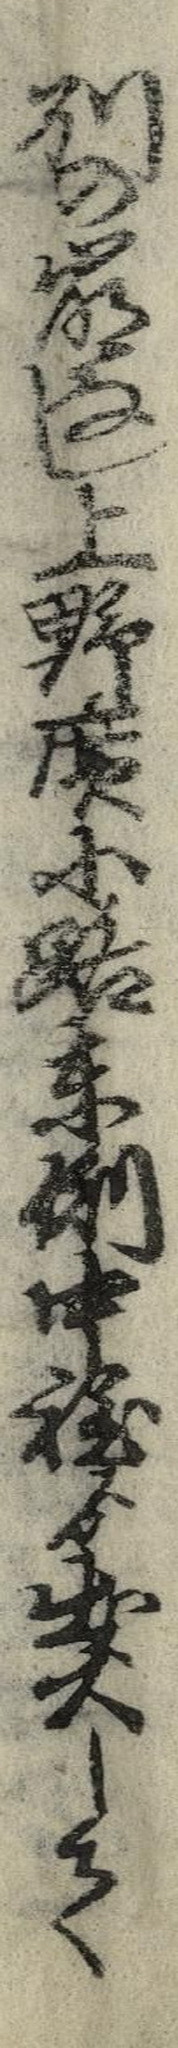別の崩なし上野広小路東側中程ゟ出火して
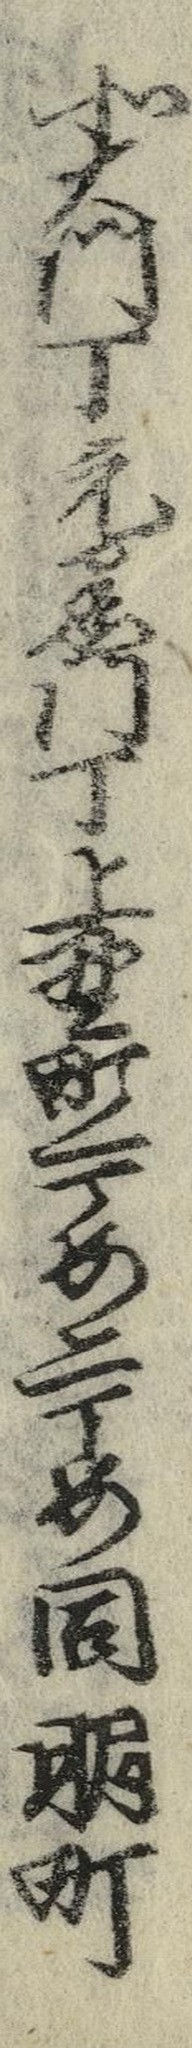北大門丁元黒門丁上野町一丁め二丁め同朋町
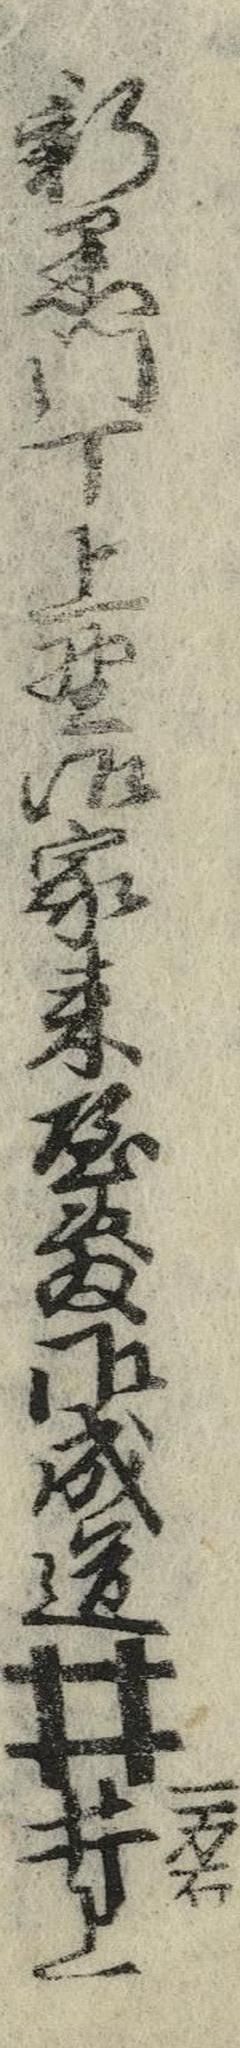新黒門丁上野御家来屋敷御成道井上
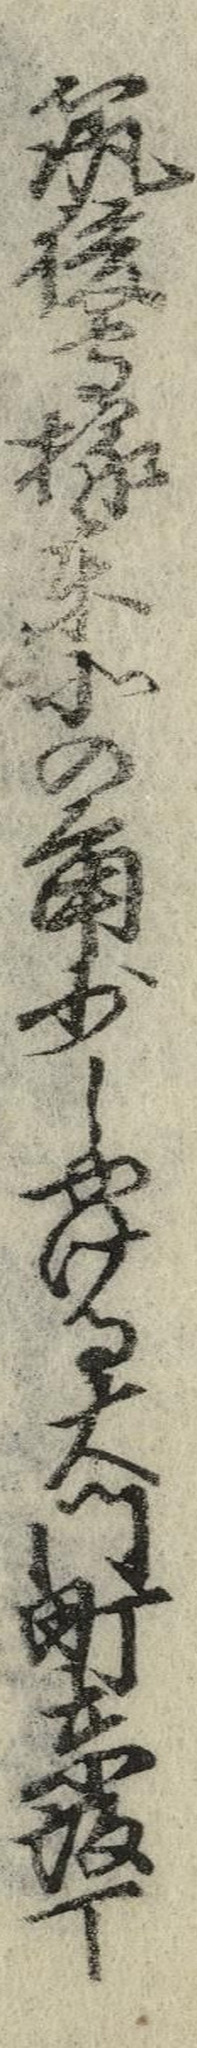筑後守様東北の角少しやける大門町車坂丁
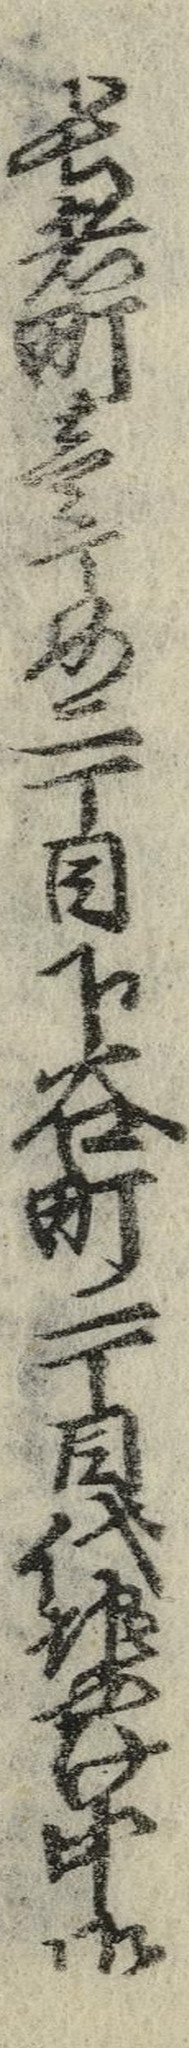長者町壱丁め二丁目下谷町二丁目代地やけ中御
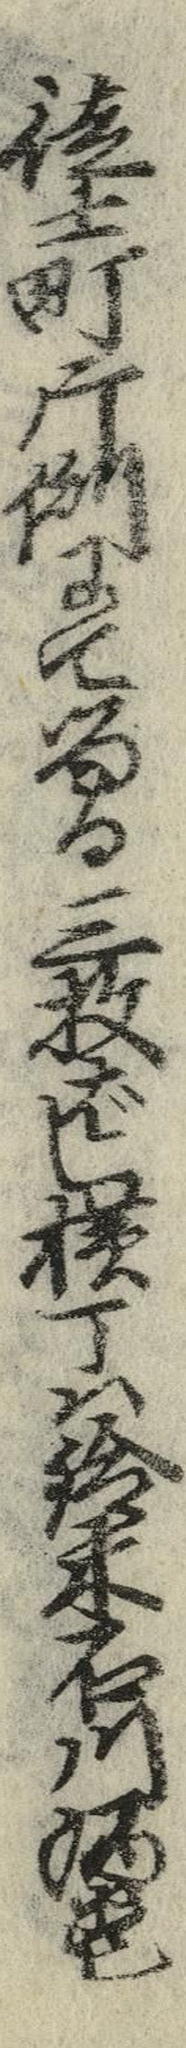徒士町片側にて留る三枚ばし横丁は鈴木石川酒巻
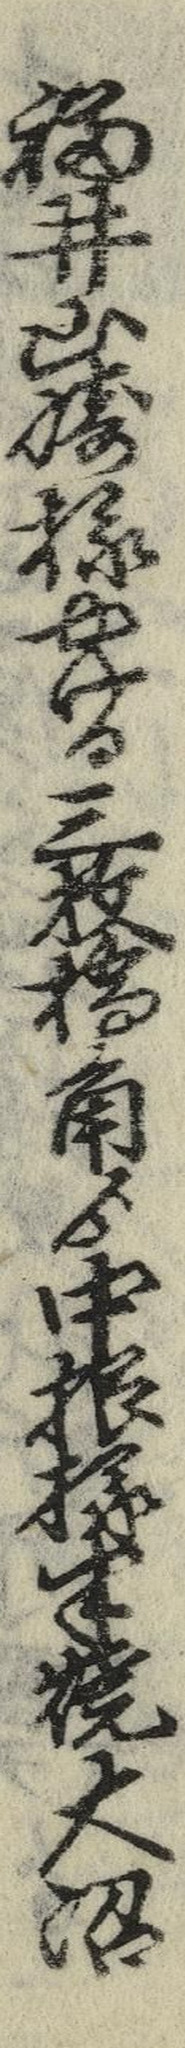福井山崎様やける三枚橋角ゟ中根様半焼大沼
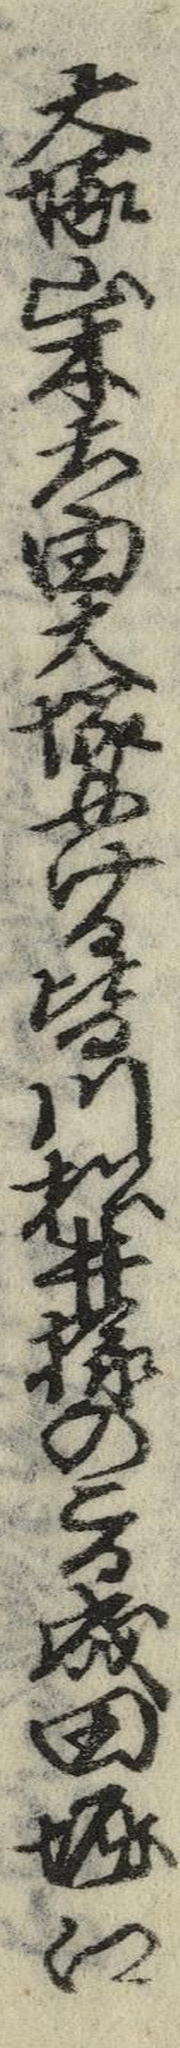大塚山木太田大塚やける皆川松井様のこる成田堀江
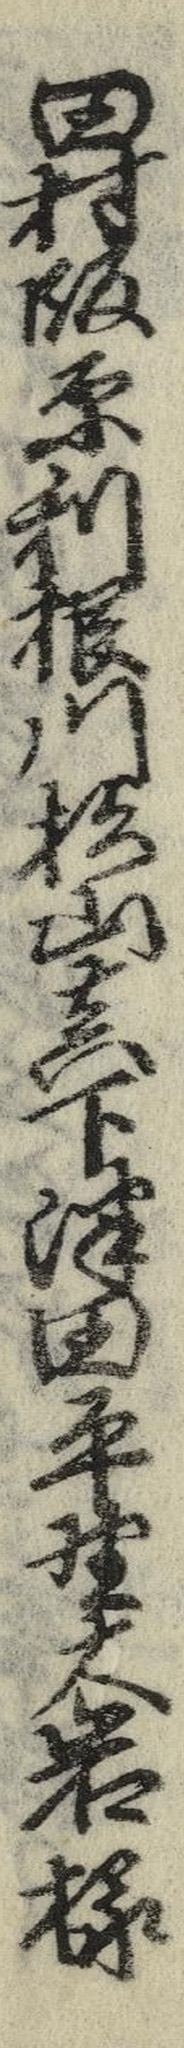田村飯原利根川杉山真下津田平野大岩様
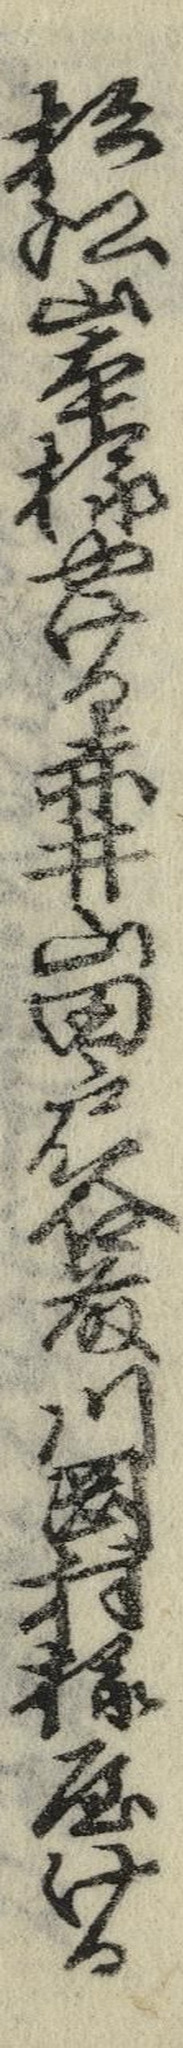杉江山本様やける赤井山田戸谷藤川岡村様やける
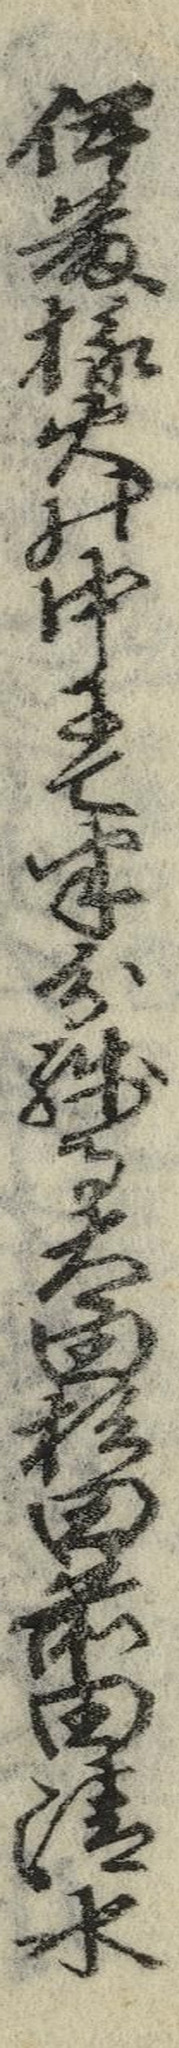伊藤様火の中にて半分残る太田杉田前田清水
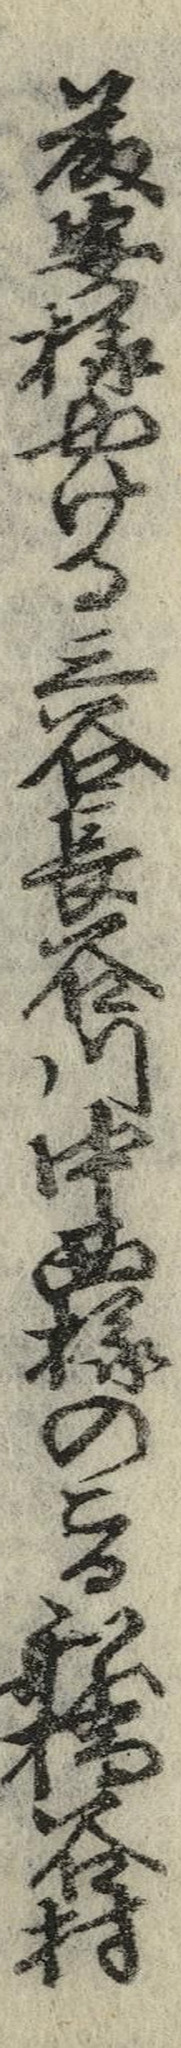藤安様やける三谷長谷川中西様のこる船橋谷村
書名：地震類焼場所明細書之写　安政二卯年十月二日夜四ツ時過　御府内御屋敷方市中共、并街道筋近郷聞書
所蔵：東京大学地震研究所図書室 Earthquake Research Institute Library, The University of Tokyo, JAPAN
